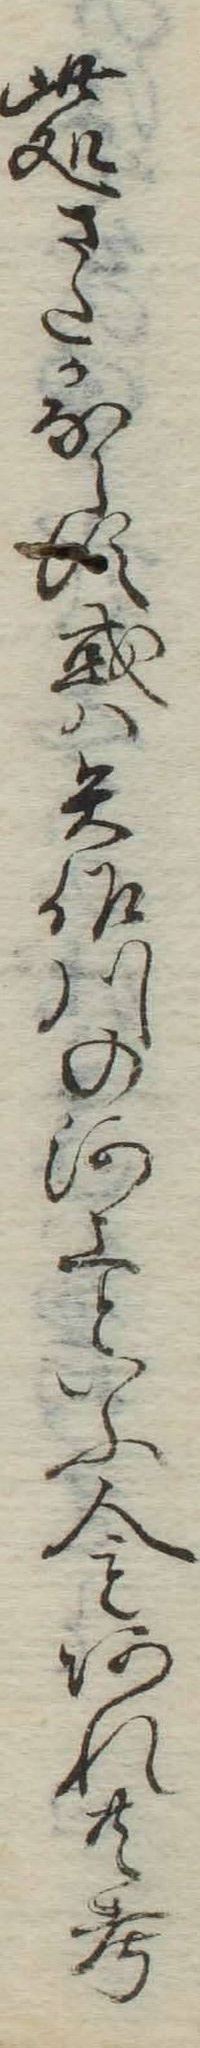此処さたかならす或は矢佐川の河上といふ人もあれ共考
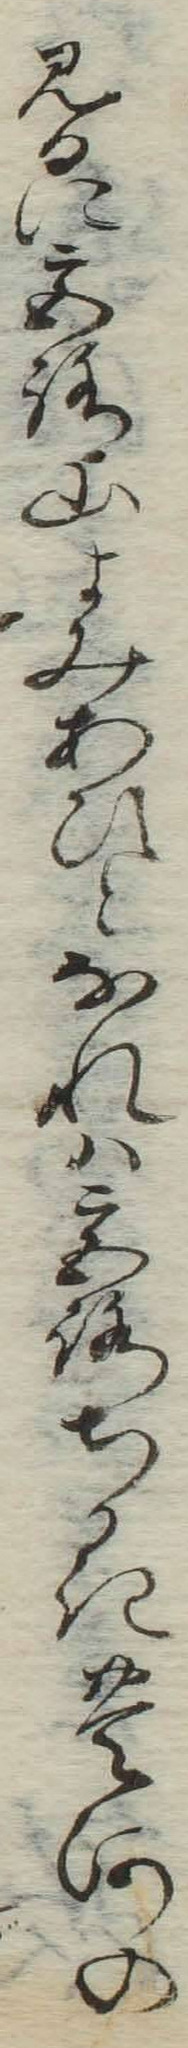見るに宮路山よみあひとなれは宮路ちかき豊河の
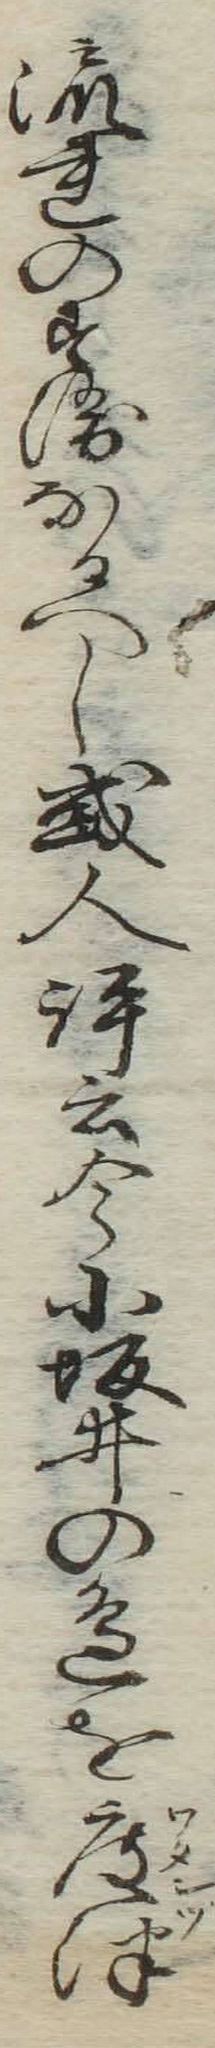流れのすゑなるへし或人評云今小坂井の辺を度津
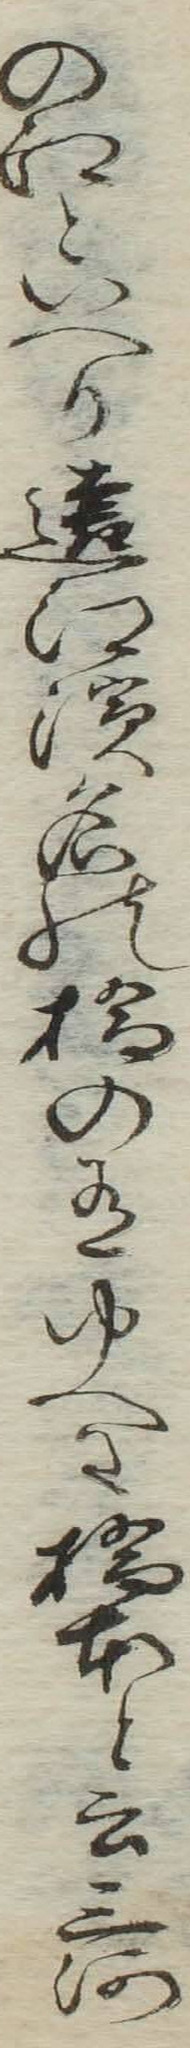の郷といへり遠江浜名の橋の有ゆへに橋本と云三河
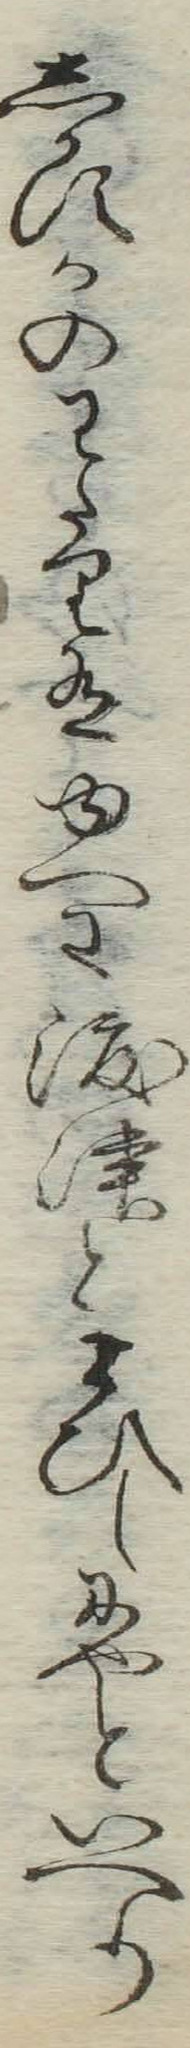しかすかのわたり有ゆへに渡津といひしにやといへり
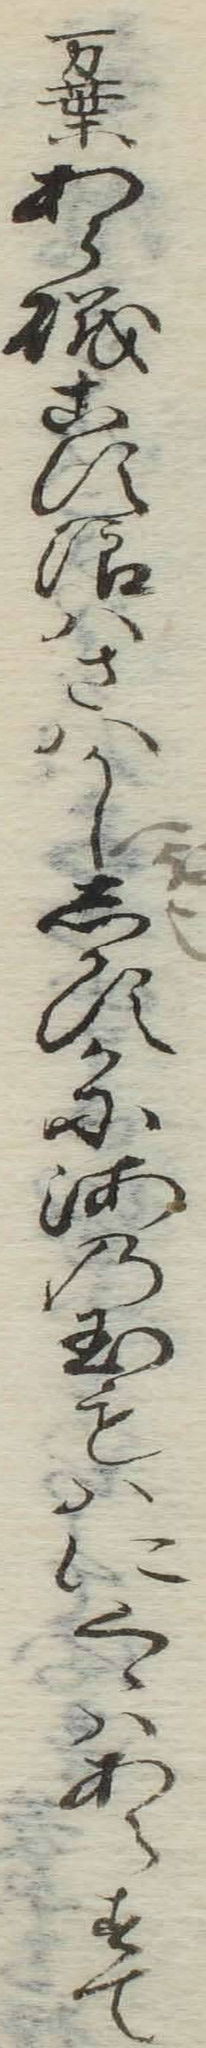万葉あら磯こす浪はさはかししかすかに海の玉もはにくゝはあらすて
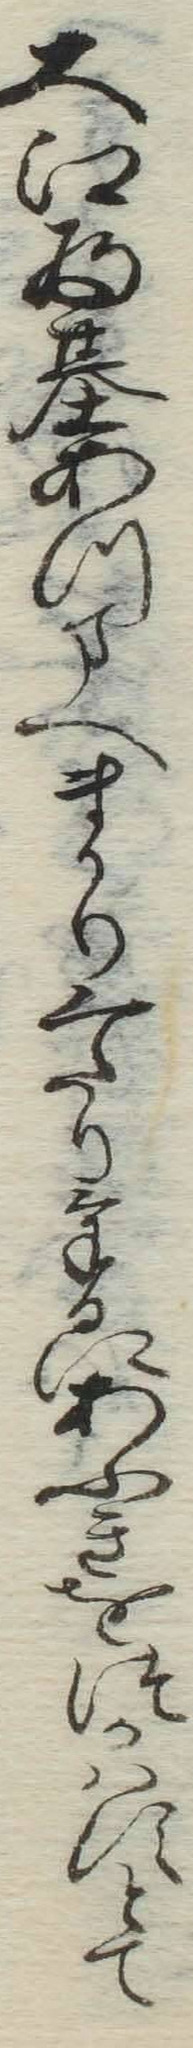大江為基あつまへまかりくたりけるにあふきをつかはすとて
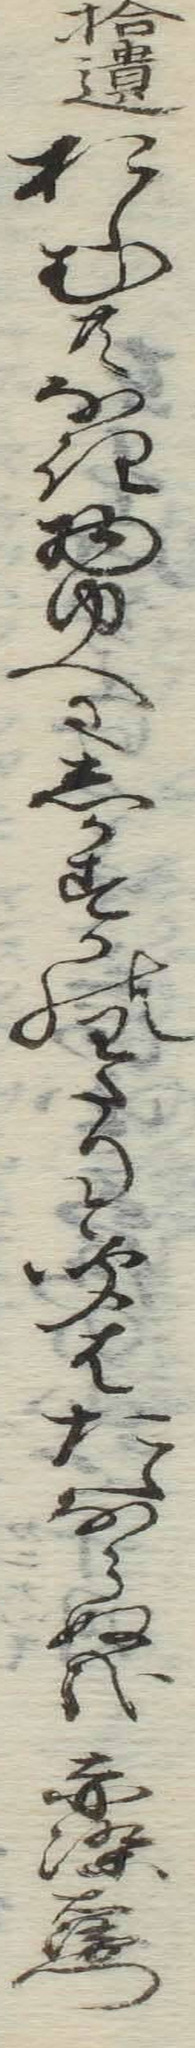拾遺おしむ共なき物ゆへにしかすかのわたりと聞はたゝならぬ哉赤染右衛門
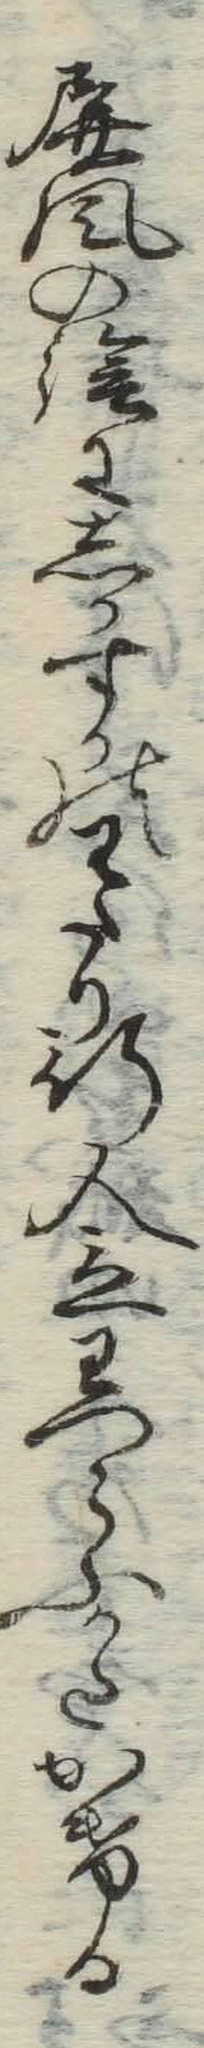屏風の陰にしかすかのわたり行人立わつらふかたかける
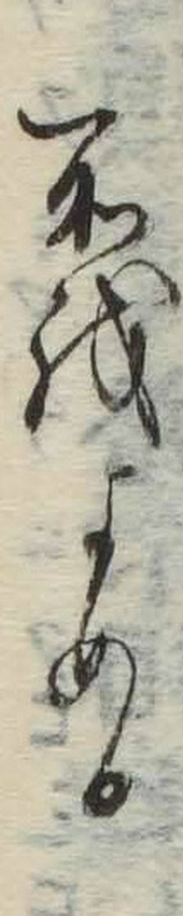所をよめる
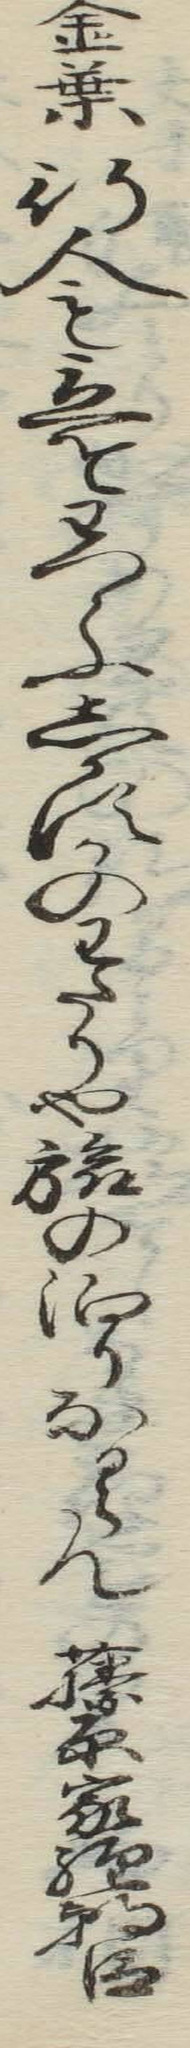金葉行人も立をわつらふしかすかのわたりや旅の泊りなるらん藤原家隆朝臣
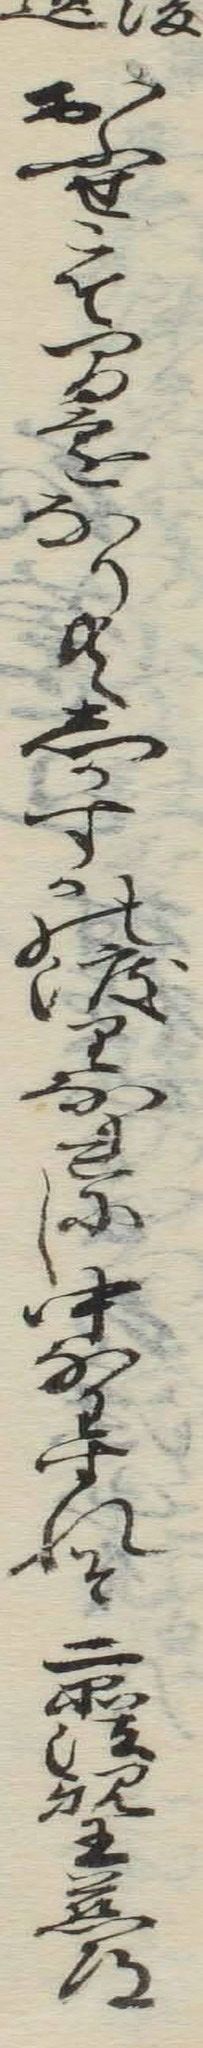続後拾遺おふせこそ間遠なり共しかすかの渡りなれにし中なにすれそ二品法親王慈道
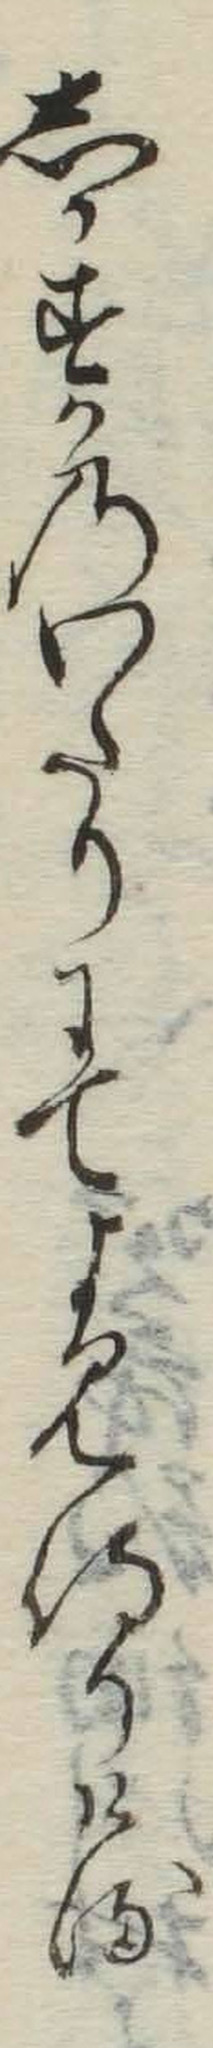しかすかのわたりにてよみ侍りける
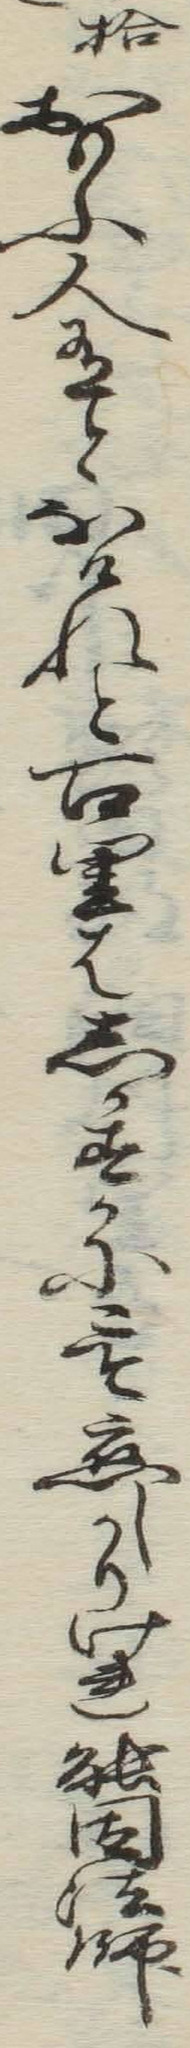後捨遺おもふ人有となけれと古里はしかすかにこそ恋しかりけれ能因法師
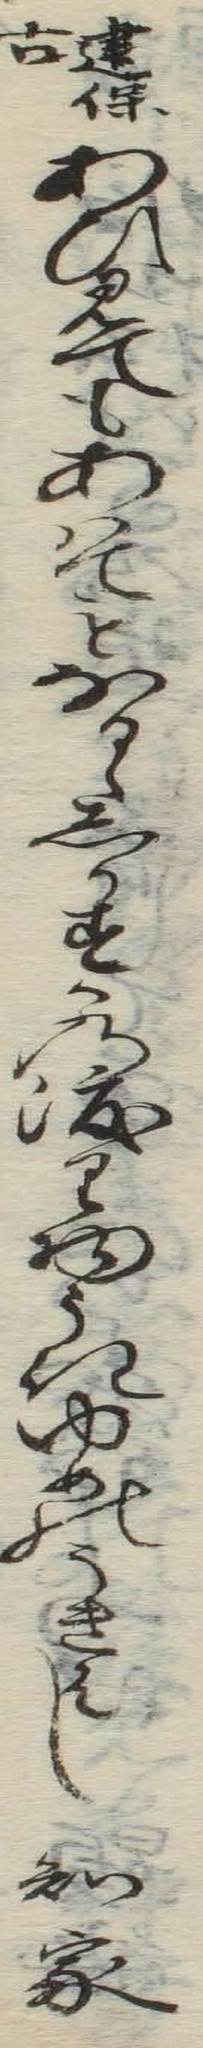建保古あひ見てもあはてもなるゝしかすかの渡り物うきゆめのうきはし知家
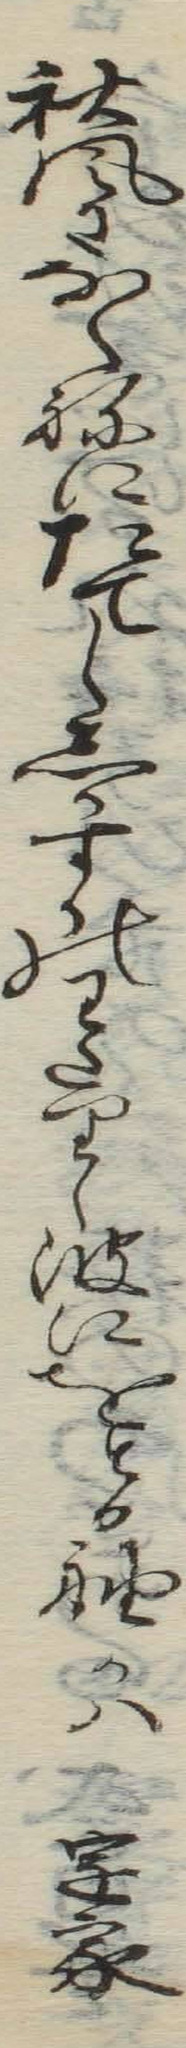秋風にならねにたてししかすかのわたりし波にをとる袖かは定家
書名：三河国二葉松
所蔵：国文学研究資料館
